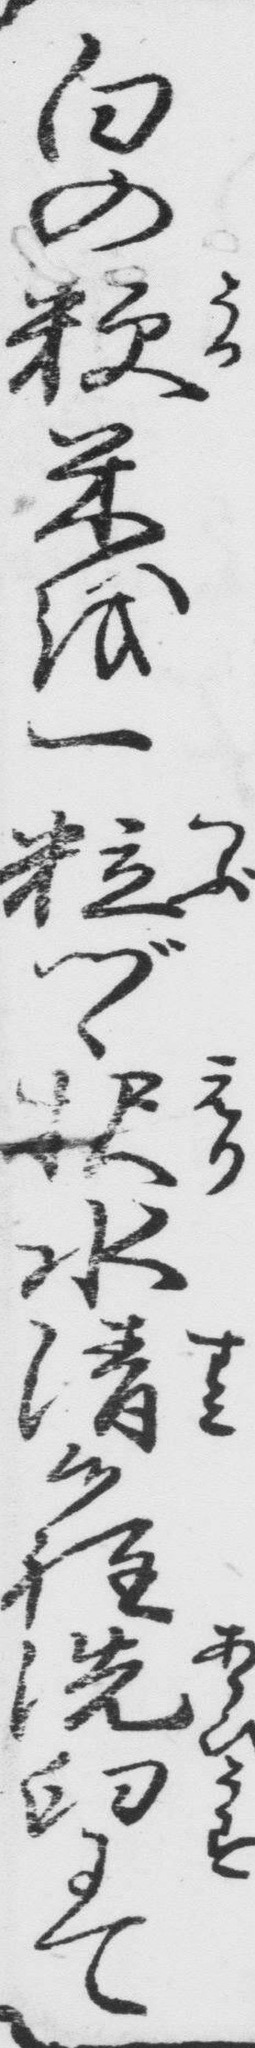白の粳米を一粒づゝ択水清候程洗臼にて
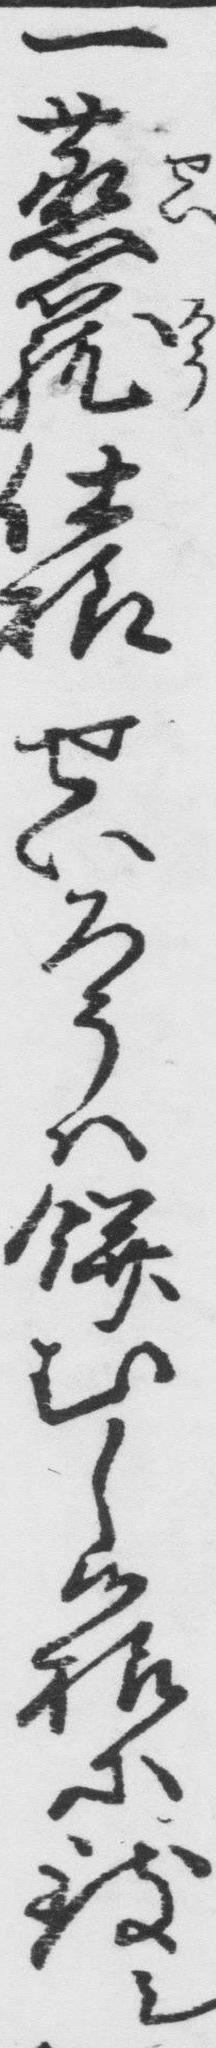一蒸籠仕様せいろうは餅むし候様に致し
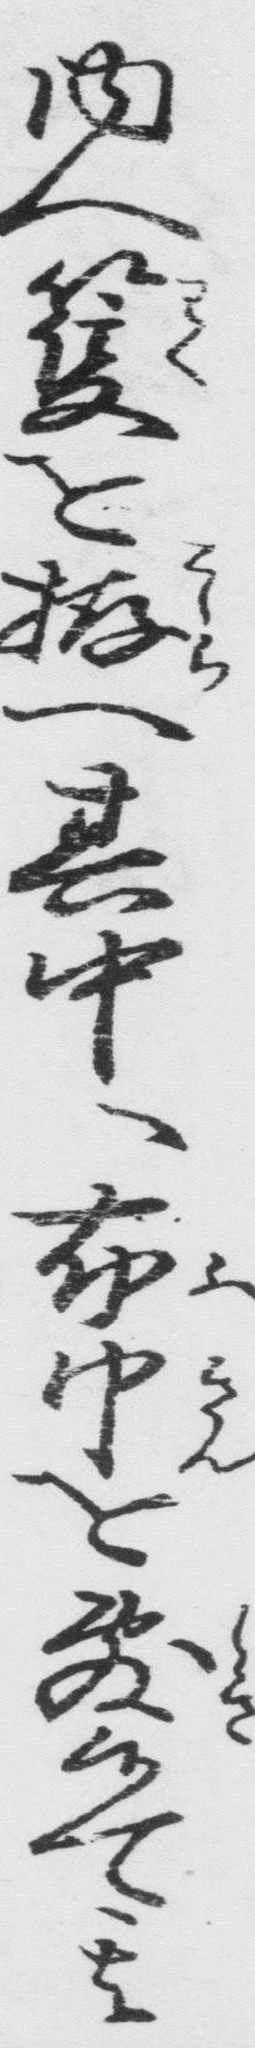内へ篗を拵へ其中へ布巾を敷候て其
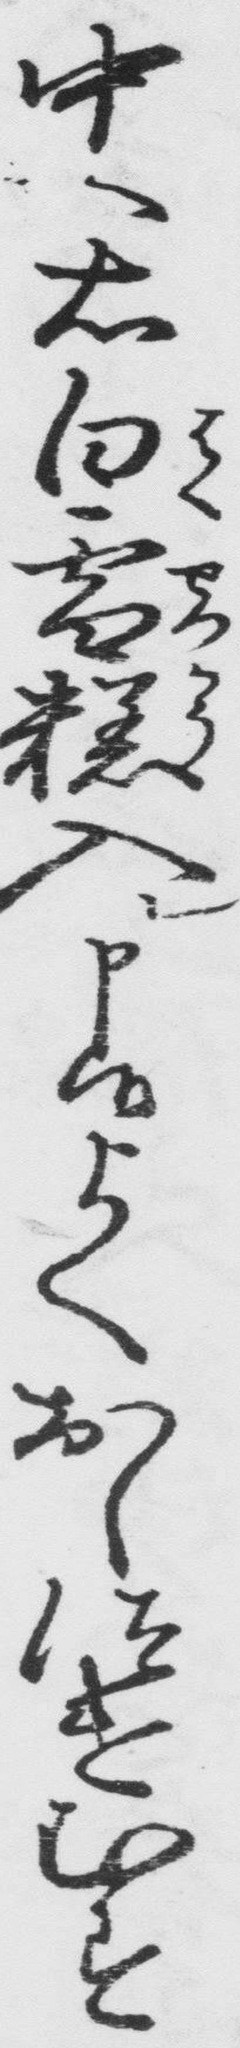中へ右白雪糕入れ申候よくおしつけむす
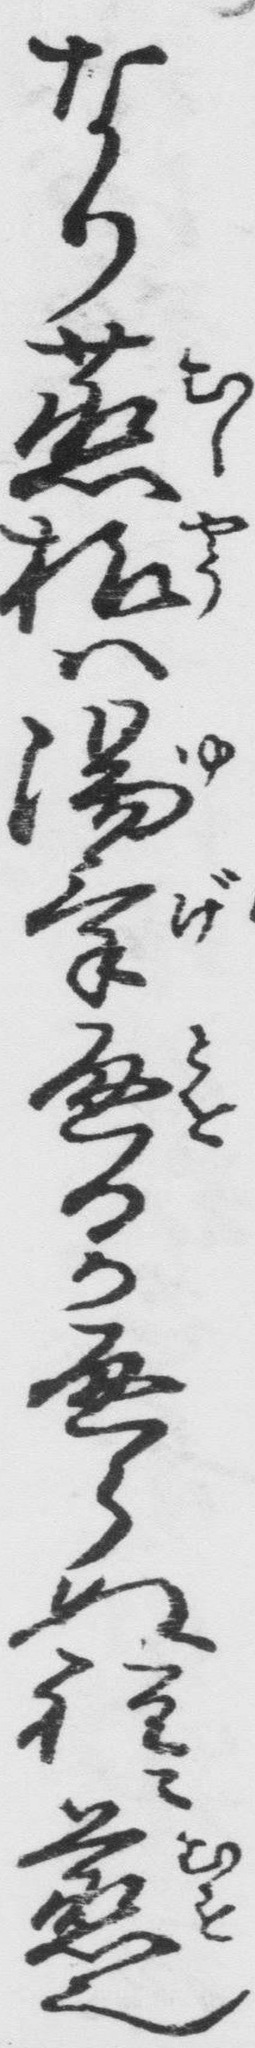なり蒸様は湯気通るか通らぬ程に蒸也
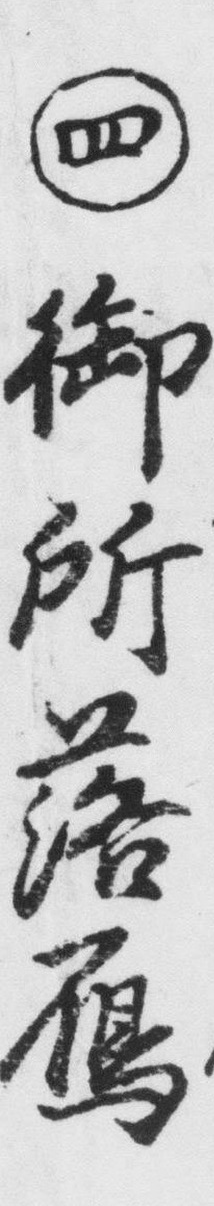(四)御所落雁

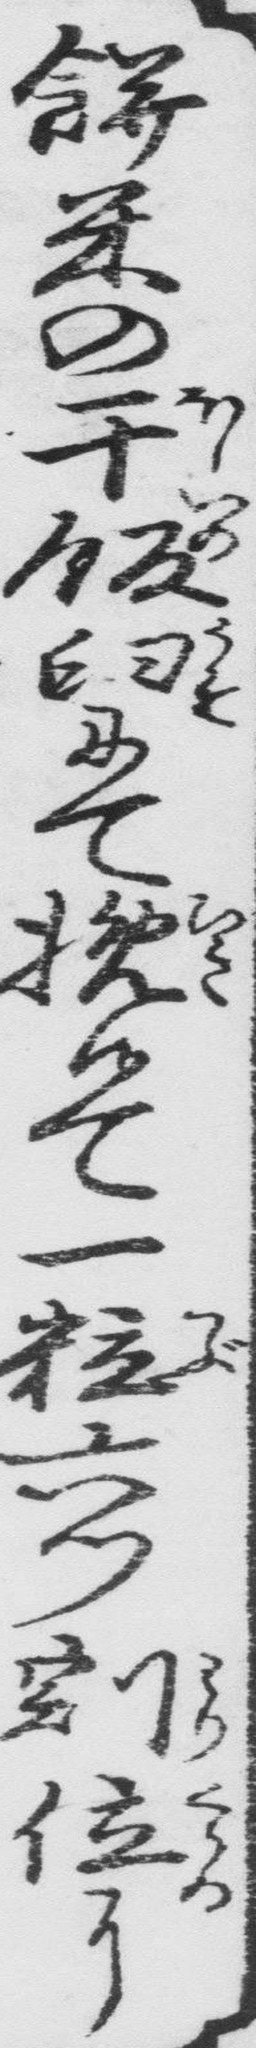餅米の干飯臼にて挽候て一粒六ツ割位に
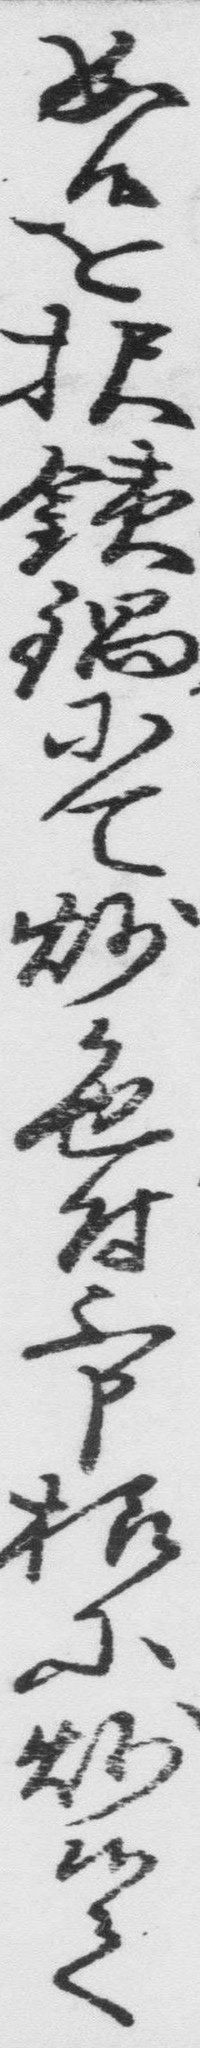成候を択鉄鍋にて炒色付不申様に炒候て
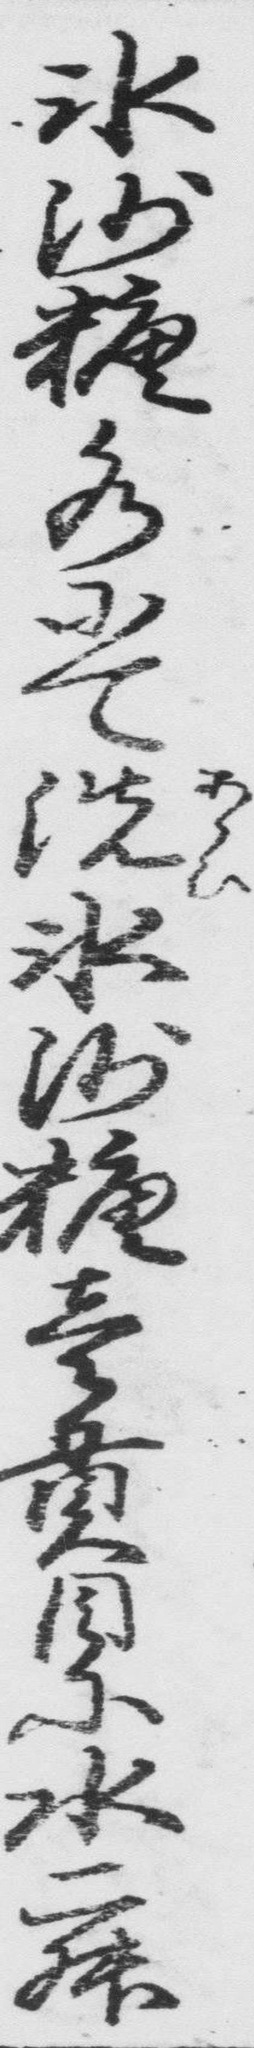氷沙糖水にて洗氷沙糖壱貫目に水二升
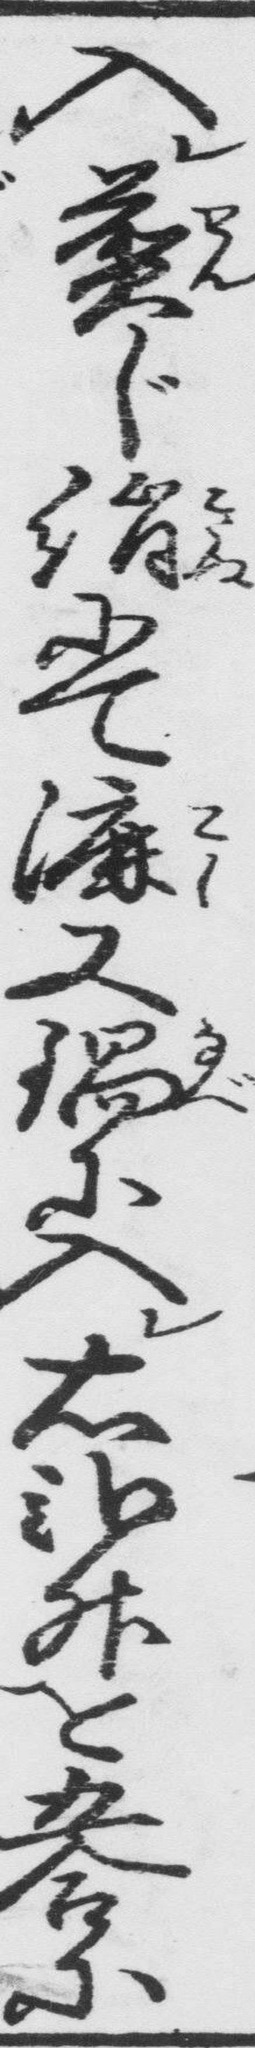入れ煎じ絹にて漉又鍋に入れ右弐升を五合に
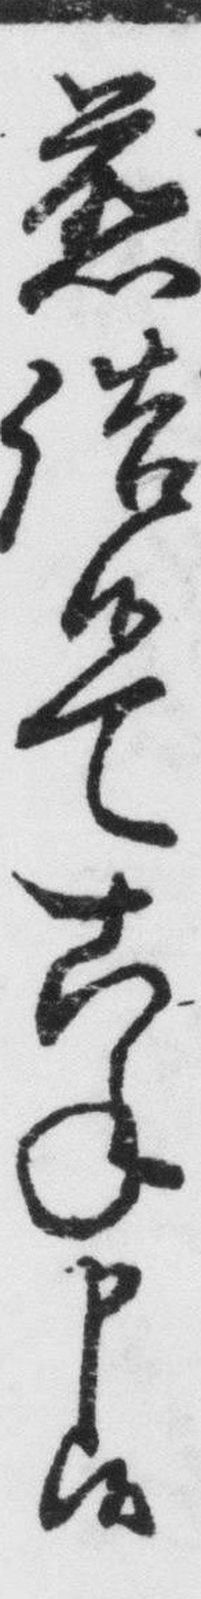煎詰候てこね申候
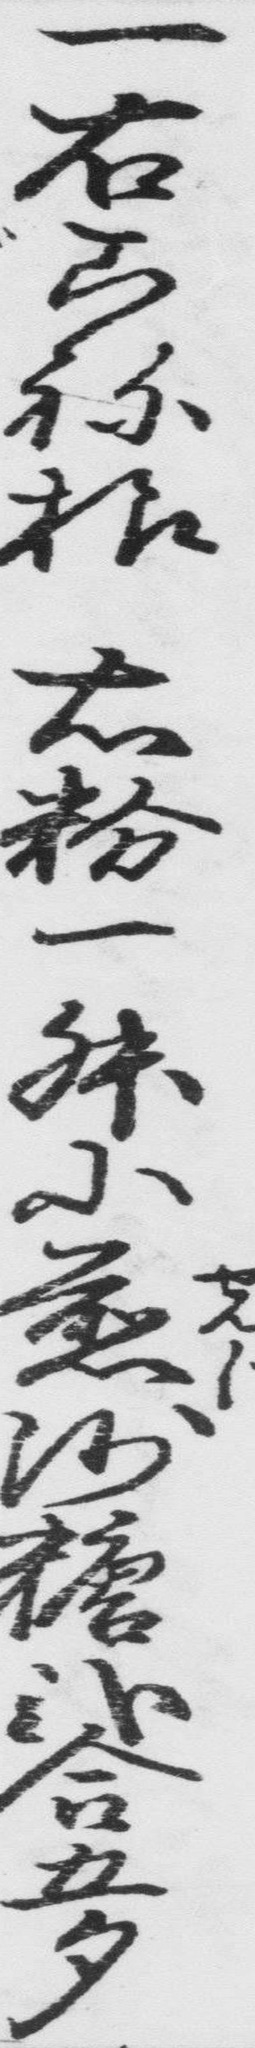一右こね様右粉一升に煎沙糖弐合五勺
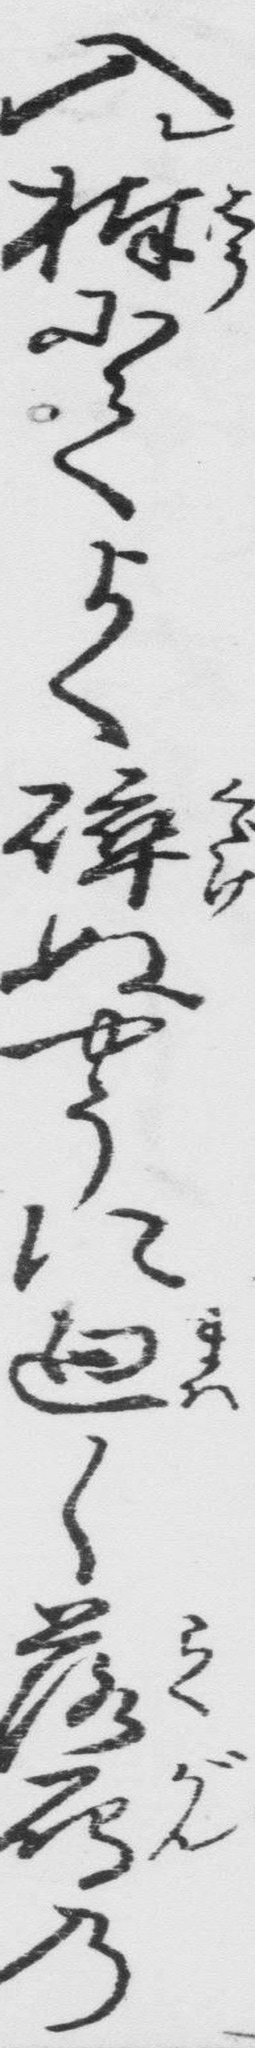入れ棒にてよく砕ぬやうに廻し落雁の
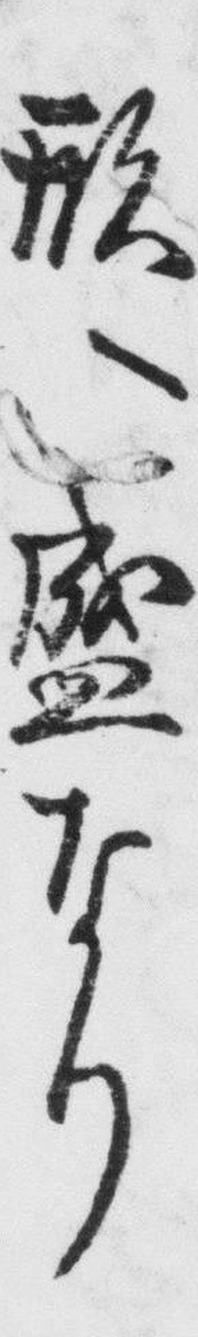形へ盛なり
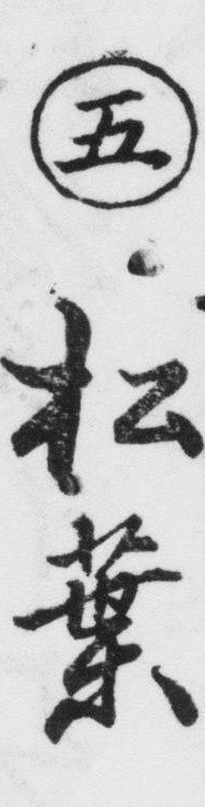(五)松葉
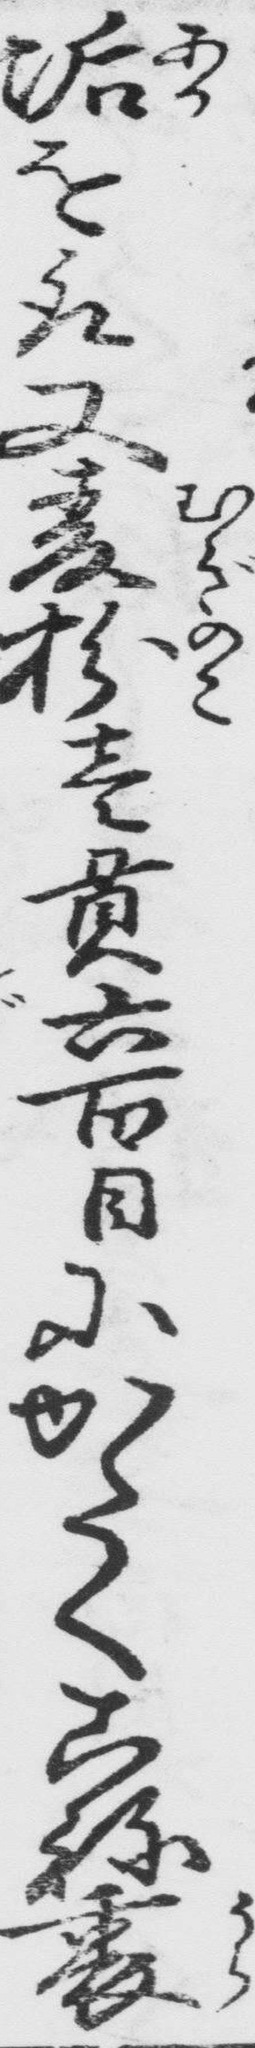垢を取又麦粉壱貫六百目にかたくこね裏
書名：御前菓子図式
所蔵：大阪府立大学学術情報センター 国文学研究資料館
